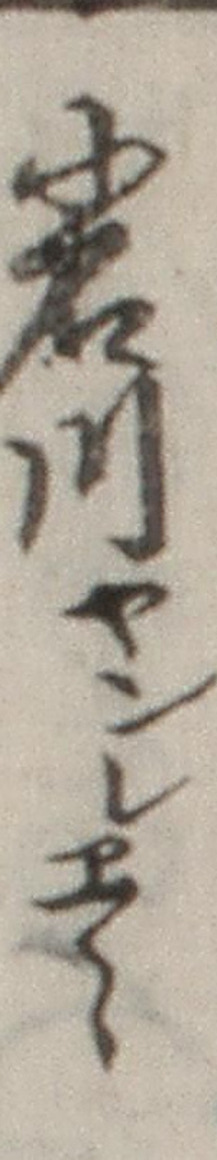小石川ヤンレエゝ
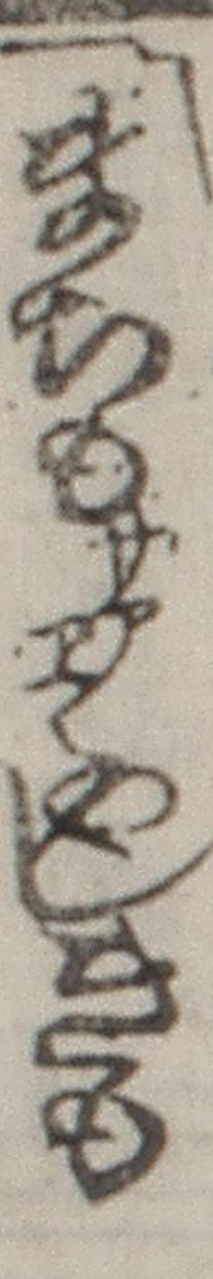まちもサアヱゝやしきも
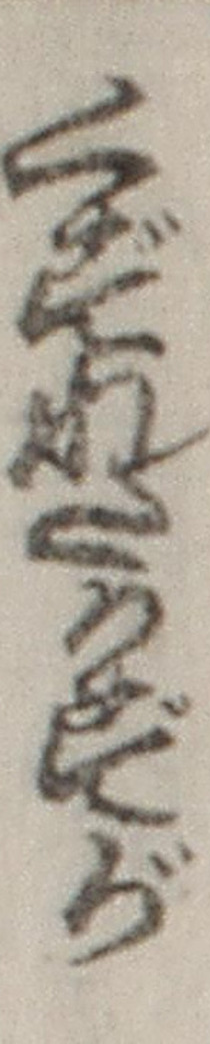くずれたかずが
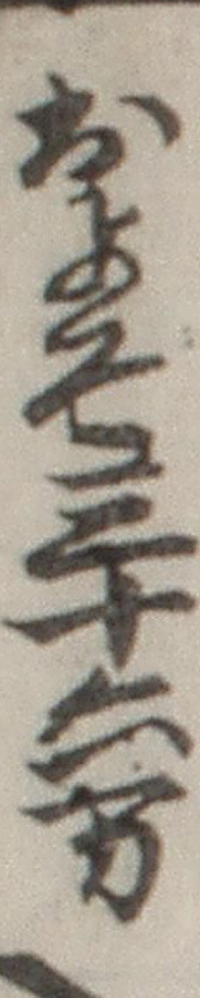およそ三十六万

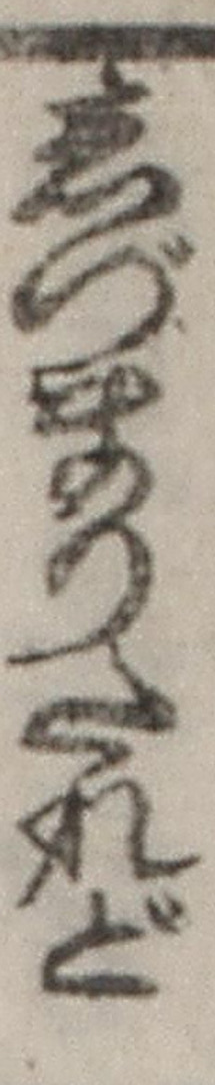しづまりたれど
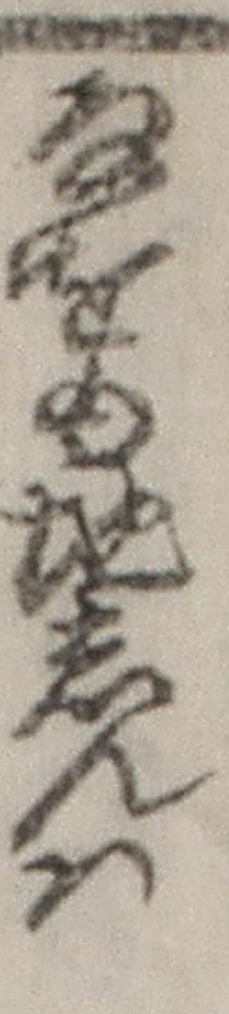なをも地しんは
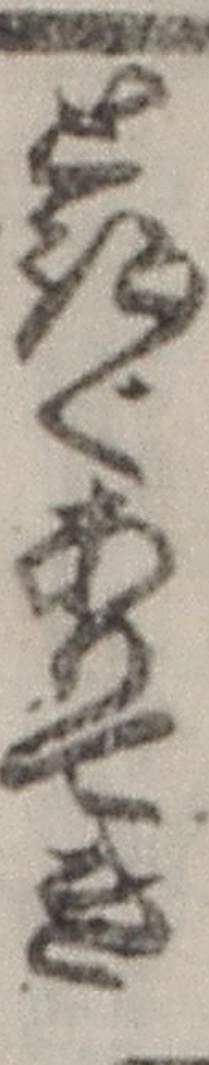とき〴〵ありてき
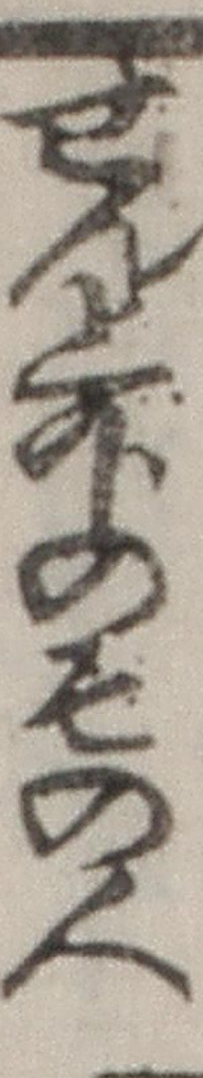せん上下のその人
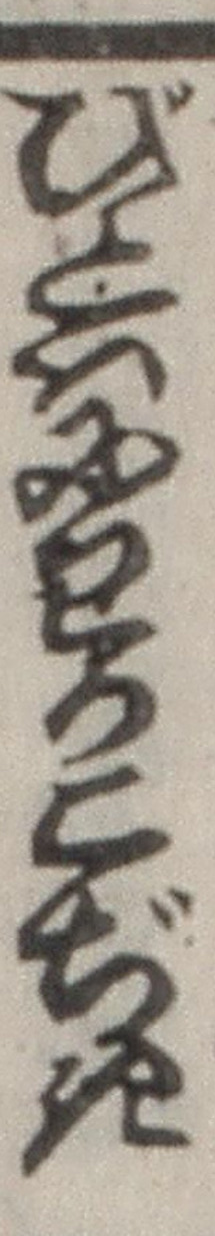びとはにわかこぢき
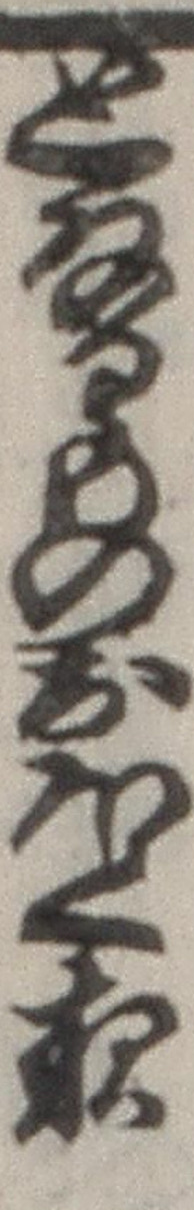となるものおほく夜
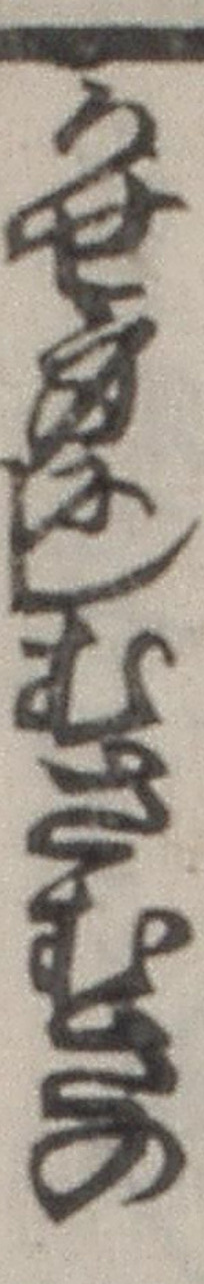かせ身にしむさむさの
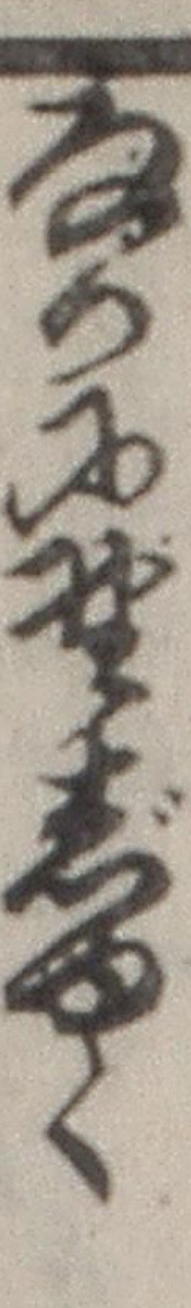なかに野じゆく
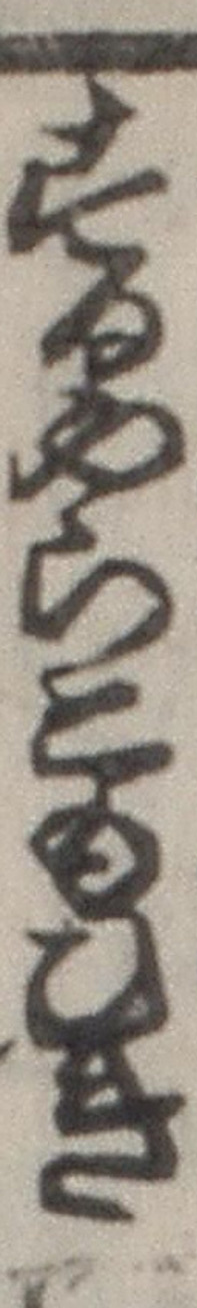するやらこもひき
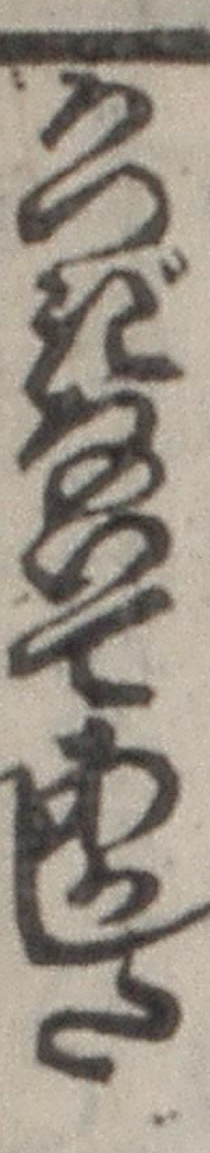かつぎないてあかした
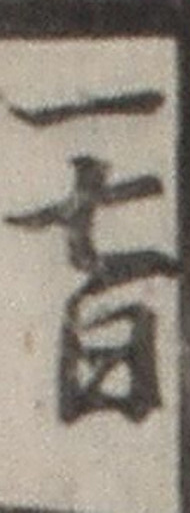一七日
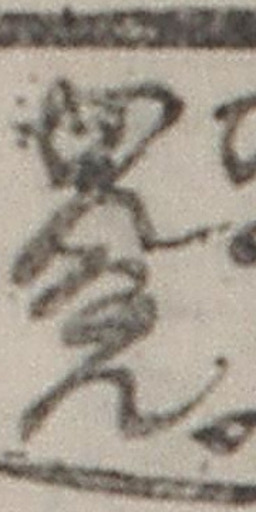かんなん
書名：安政二卯年　江戸大地震并出火附
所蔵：東京大学地震研究所図書室 Earthquake Research Institute Library, The University of Tokyo, JAPAN
